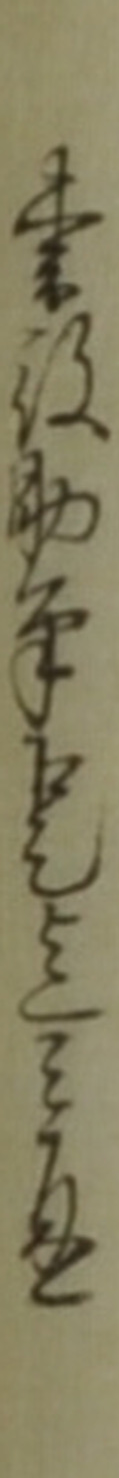書役助筆是迄之通
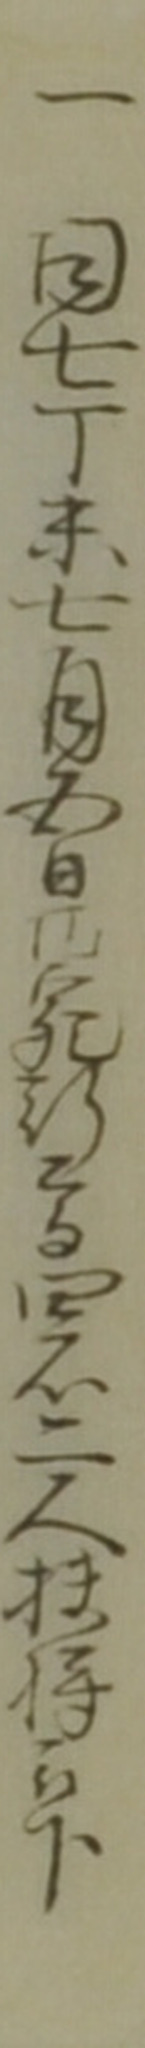一同七丁未七月五日御宛行高四石二人扶持被下
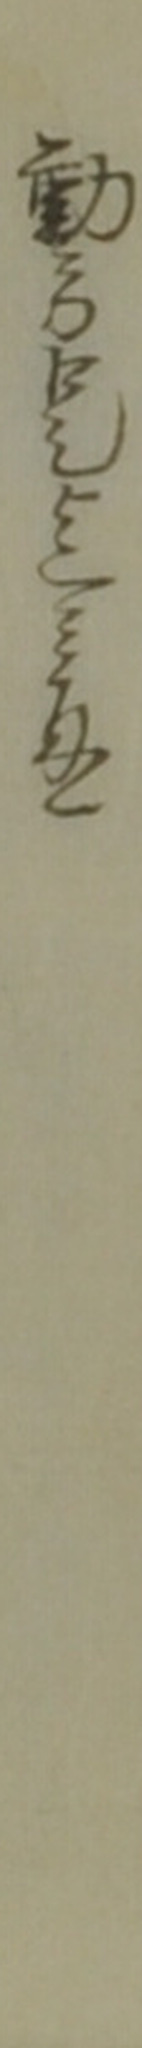勤方是迄之通
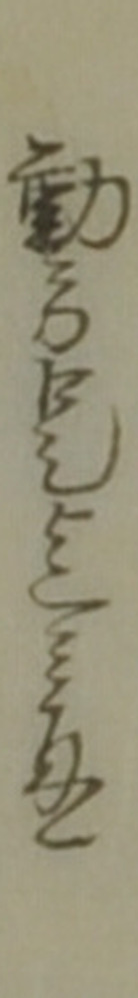勤方是迄之通
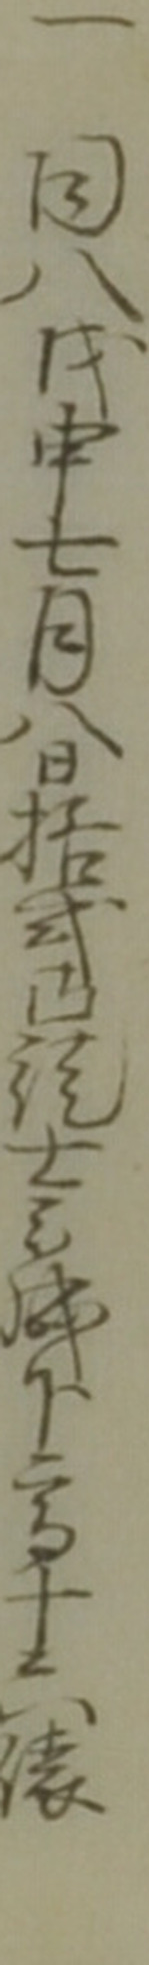一同八戊申七月八日格式御徒士被成下高十六俵
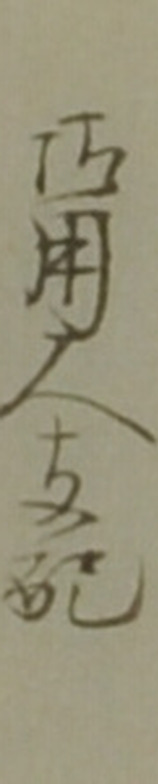御用人支配
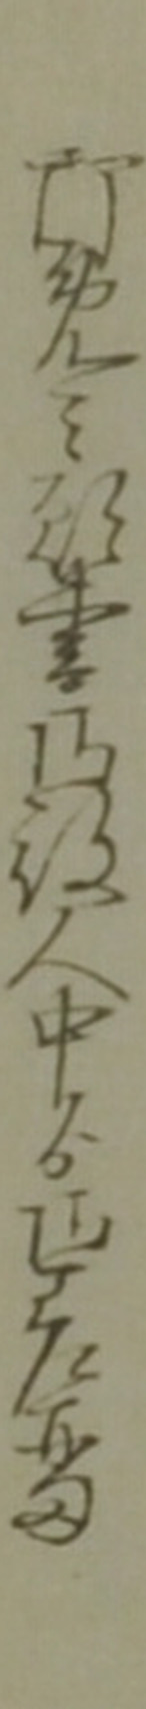御免之願書御役人中ゟ御差留

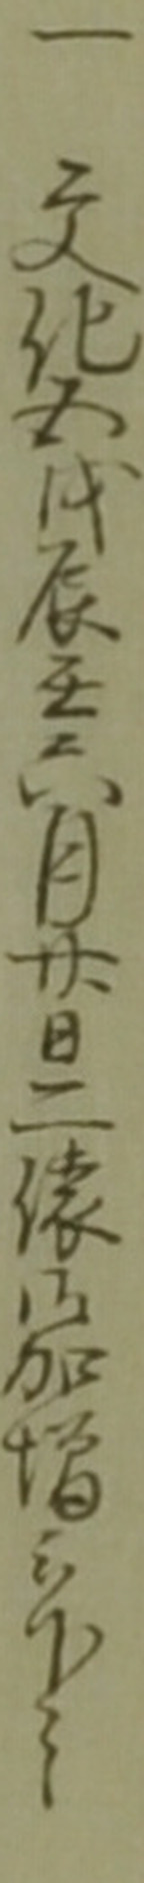一文化五戌辰閏六月廿日二俵御加増被下之
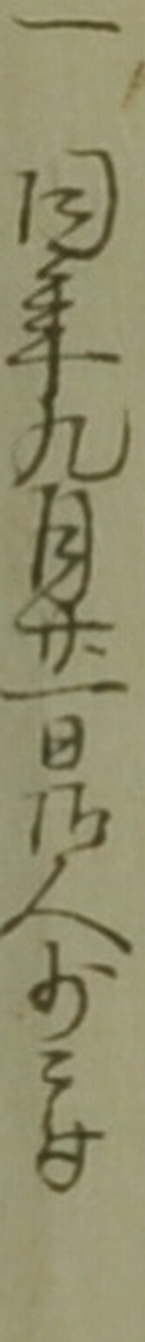一同年九月廿一日御人少ニ付
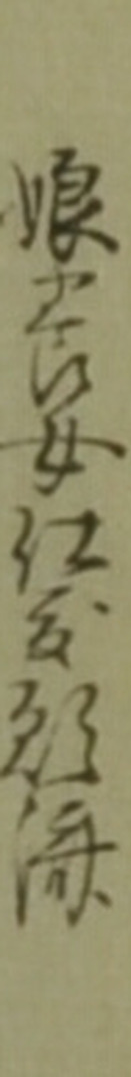娘養女仕度願済
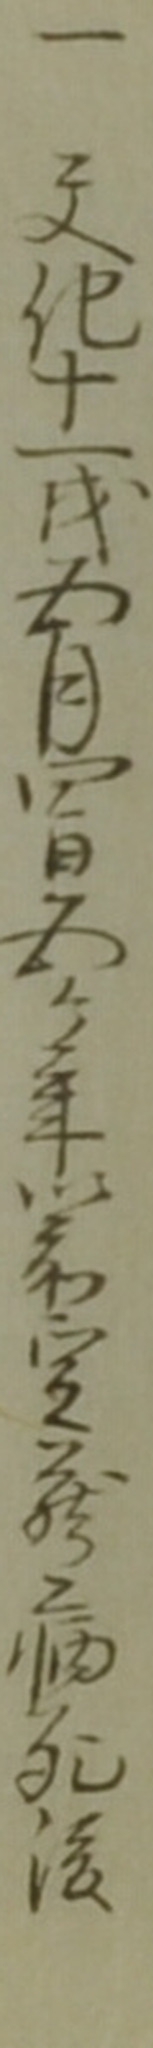一文化十一戌五月四日五ヶ年以前定蔵病死後
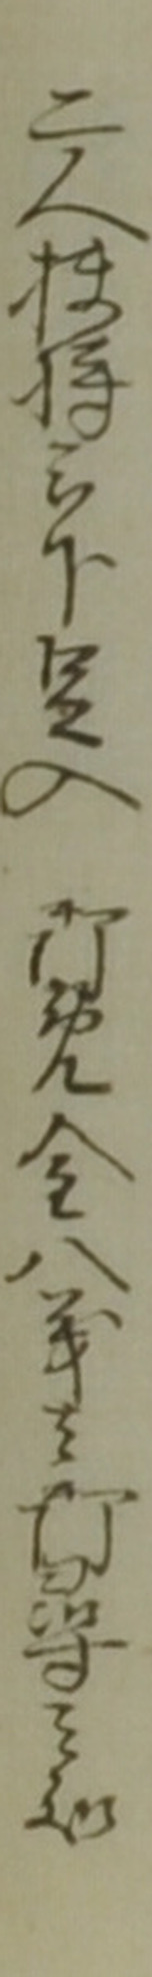二人扶持被下足入御免金八義者御尋之処
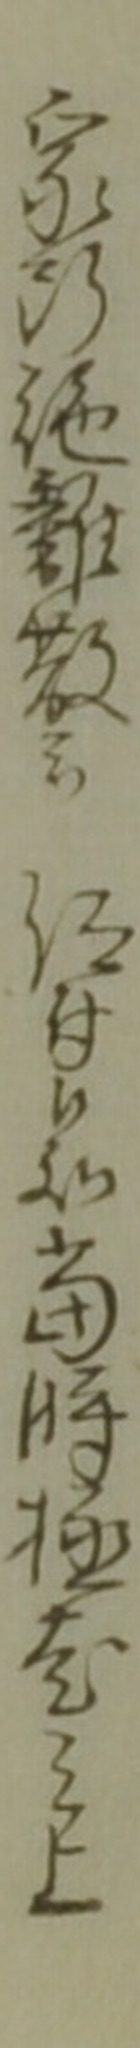家断絶離散被仰付候処当時極老之上
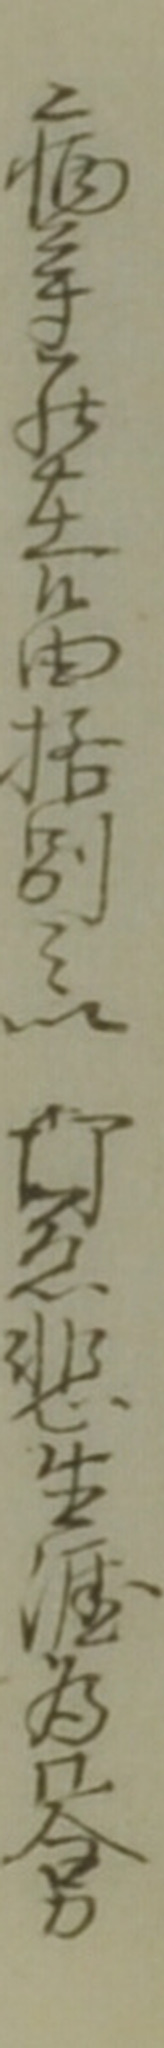病気罷在候由格別之以御慈悲生涯為御合力
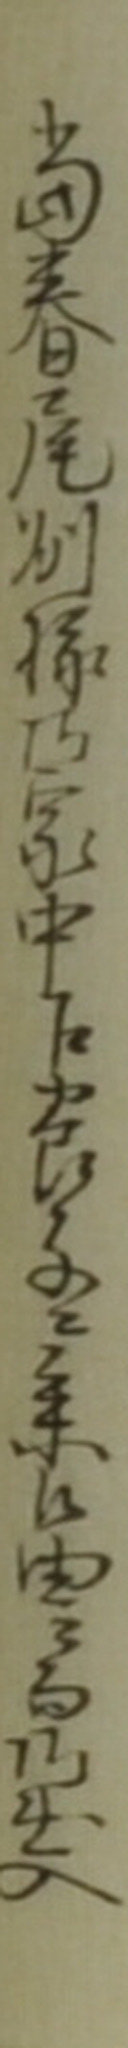当春尾州様御家中江養子ニ参候由ニ而御出入
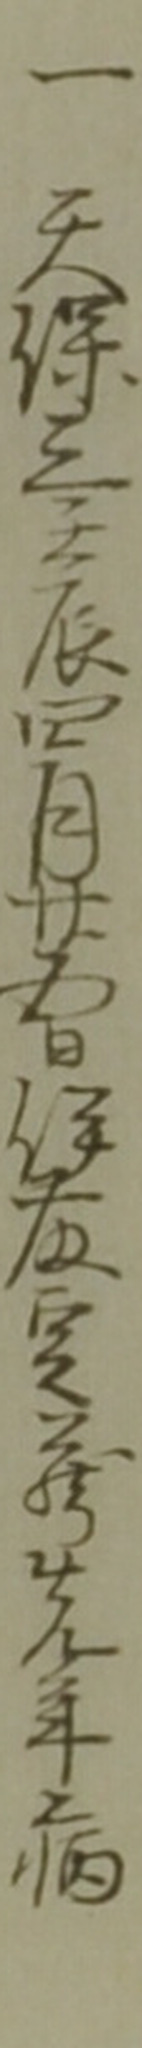一天保三壬辰四月廿五日伊藤定蔵先年病
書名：無足諸士勤仕録（九）
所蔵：伊那市立高遠町図書館・合同会社AMANE
